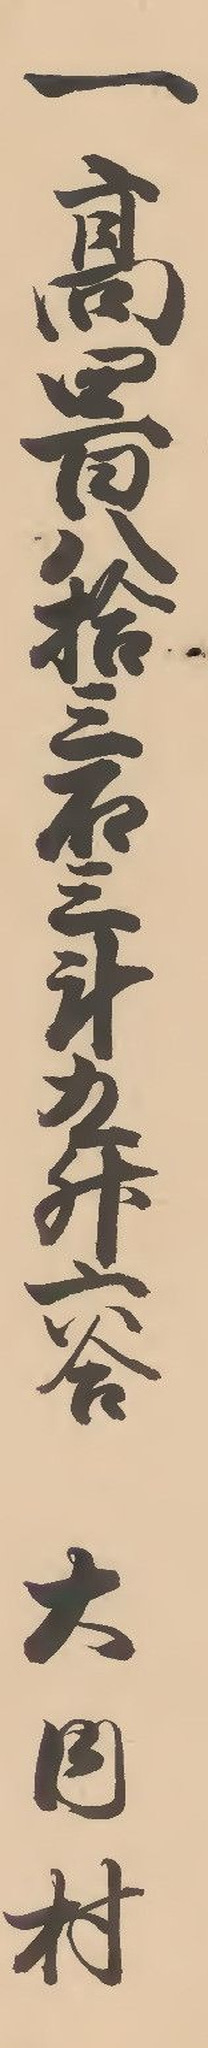一高四百八拾三石三斗九升六合大内村

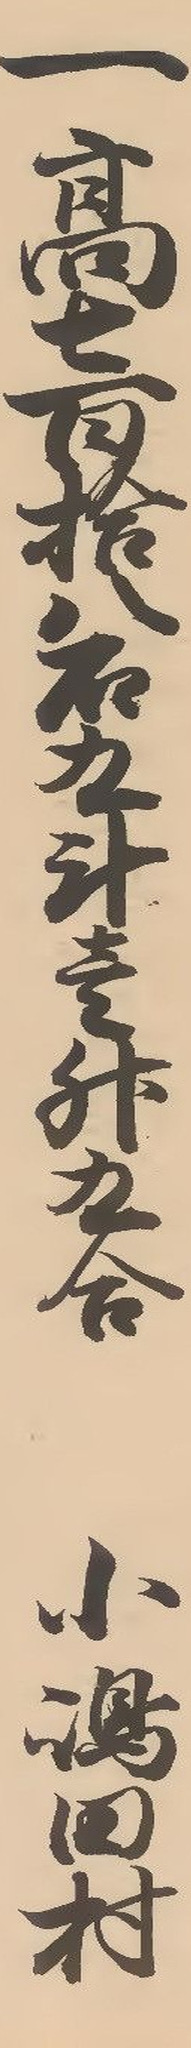一高七百拾八石九斗壱升九合小島田村
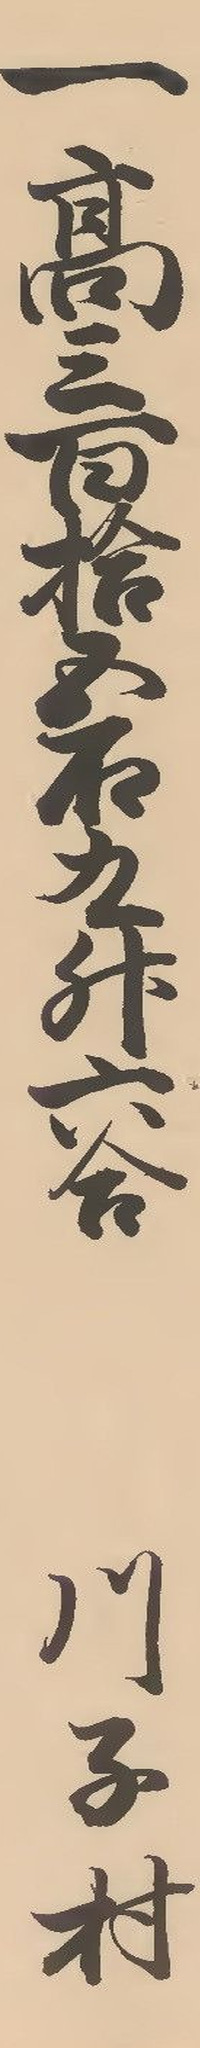一高三百拾五石九升六合川子村
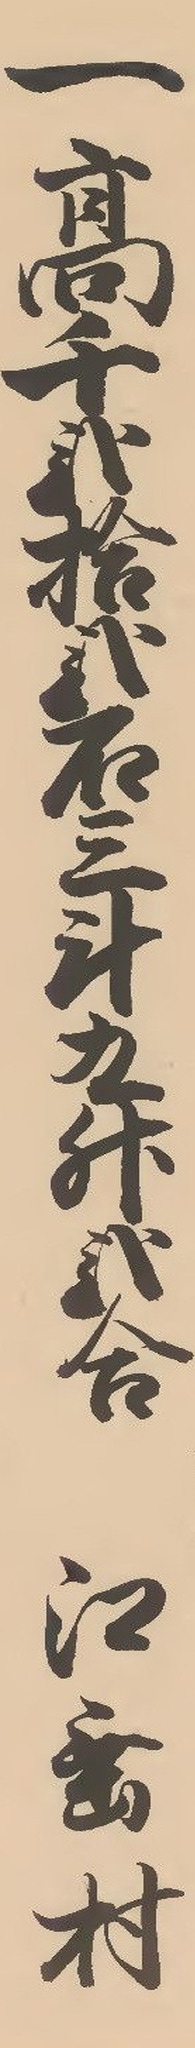一高千弐拾弐石三斗九升弐合江垂村
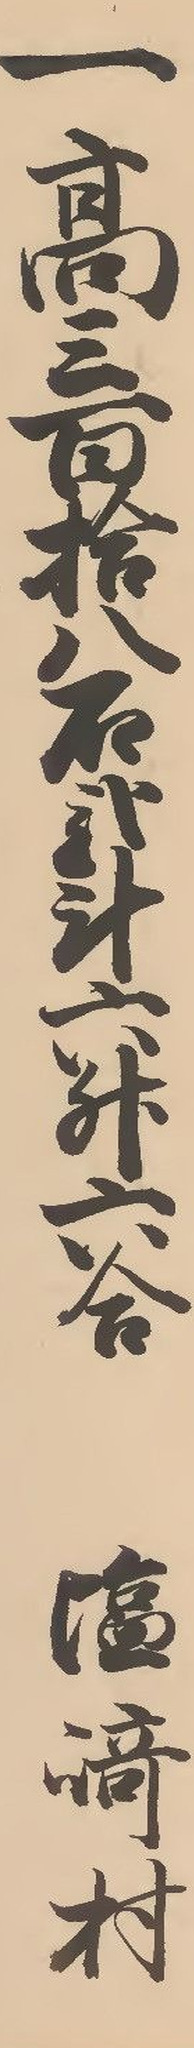一高三百拾八石弐斗六升六合塩崎村
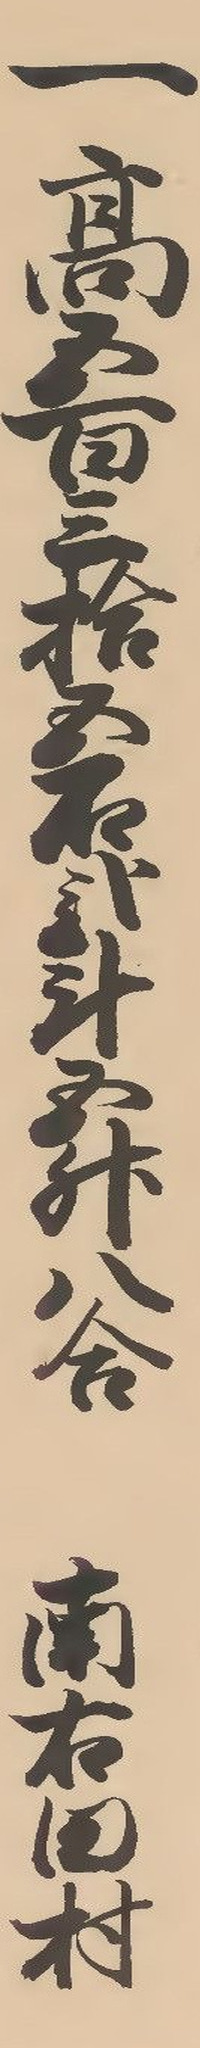一高五百三拾五石弐斗五升八合南右田村
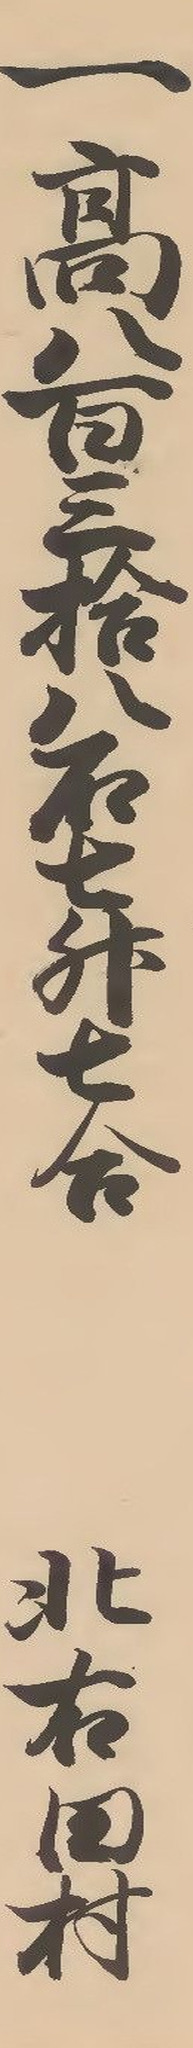一高八百三拾八石七升七合北右田村
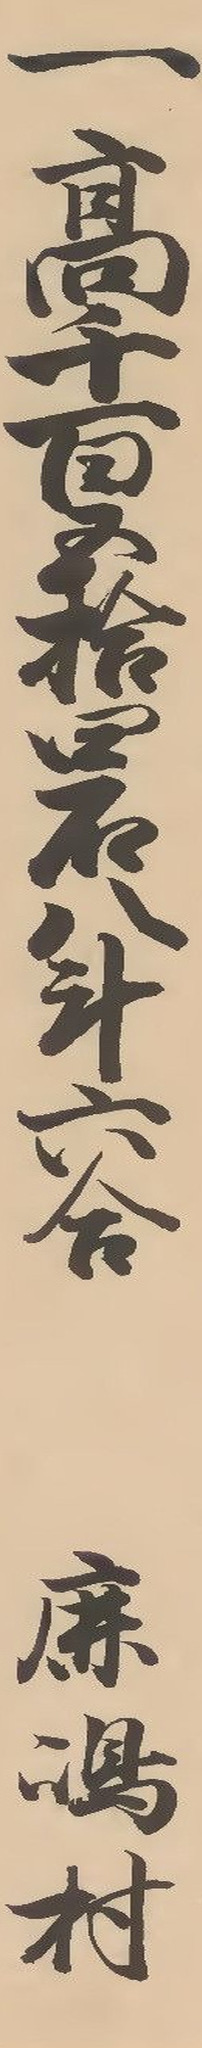一高千百五拾四石八斗六合鹿島村
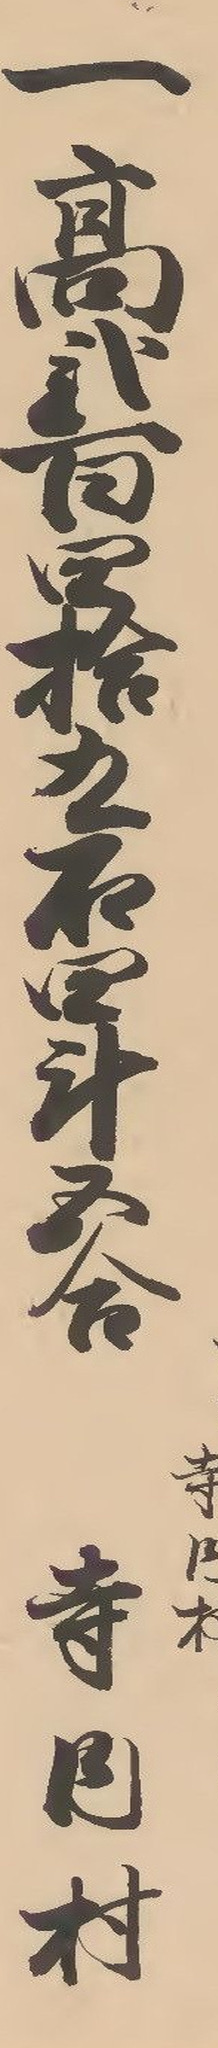一高弐百四拾九石四斗五合寺内村

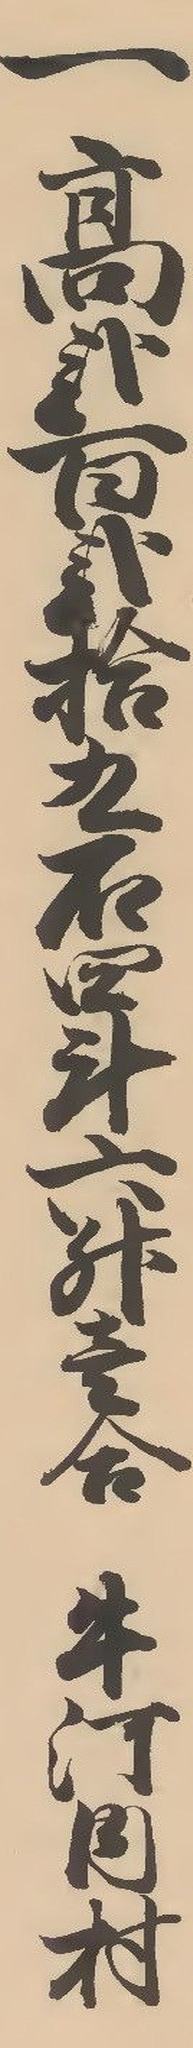一高弐百弐拾九石四斗六升壱合牛河内村
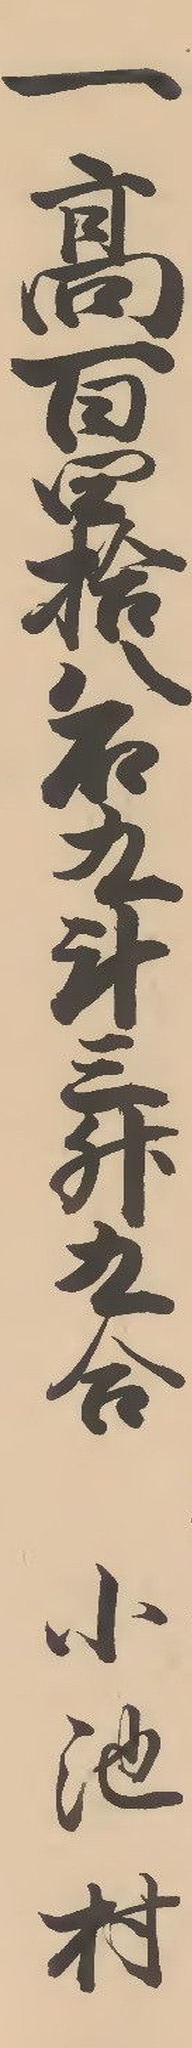一高百四拾八石九斗三升九合小池村
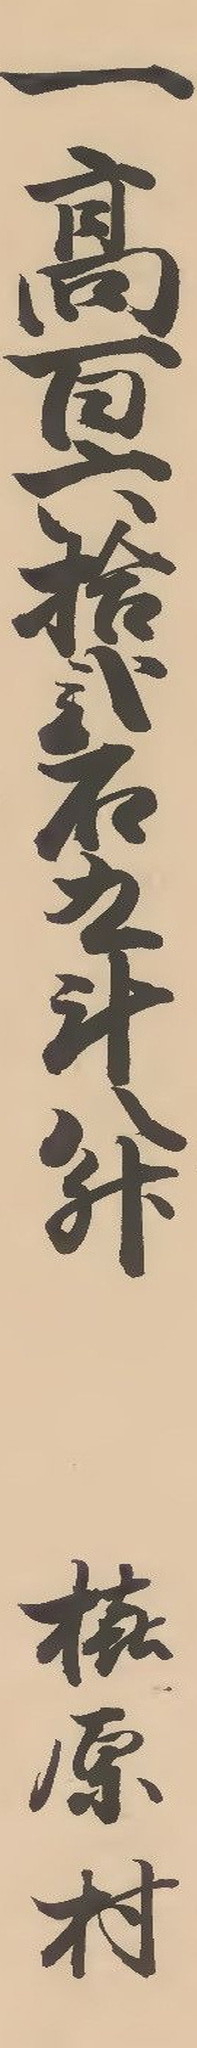一高百六拾弐石九斗八升橲原村
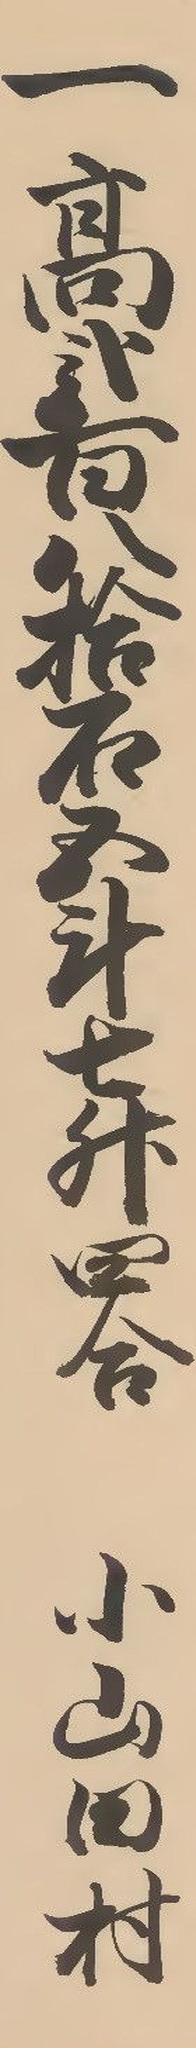一高弐百八拾石五斗七升四合小山田村
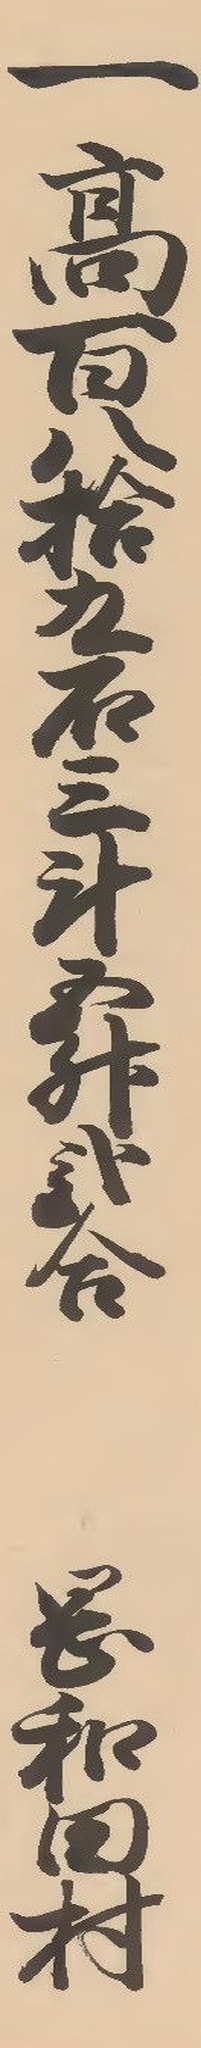一高百八拾九石三斗五升弐合岡和田村
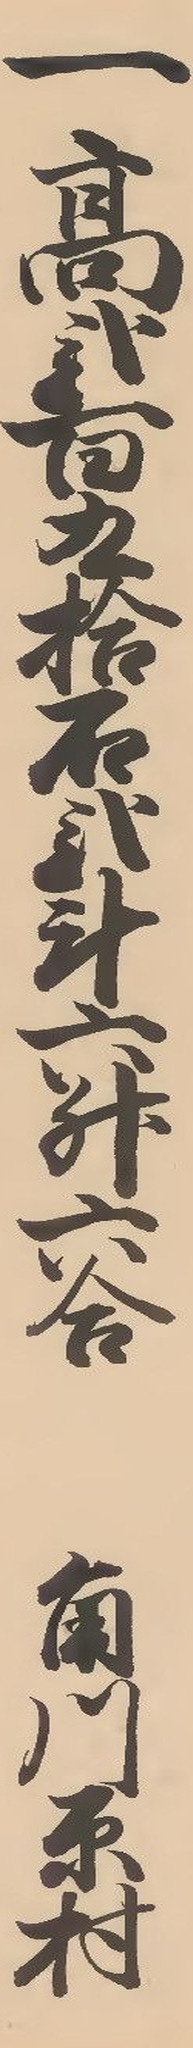一高弐百九拾石弐斗六升六合角川原村
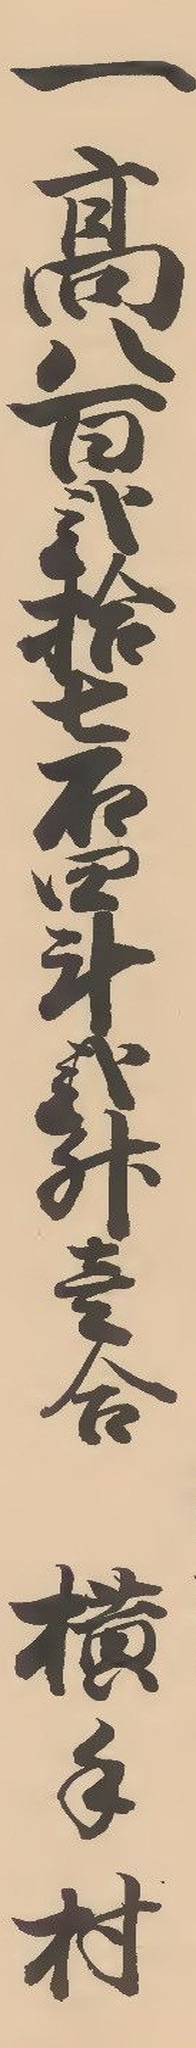一高八百弐拾七石四斗弐升壱合横手村
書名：陸奥国郷帳　３
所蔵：国立公文書館 National Archives of Japan
